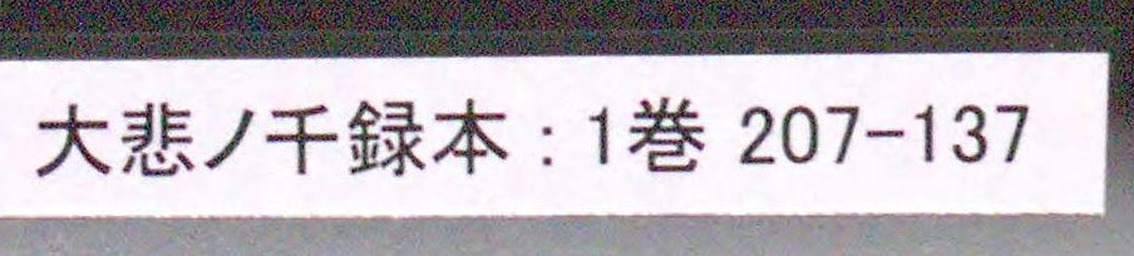大悲乃千録本全
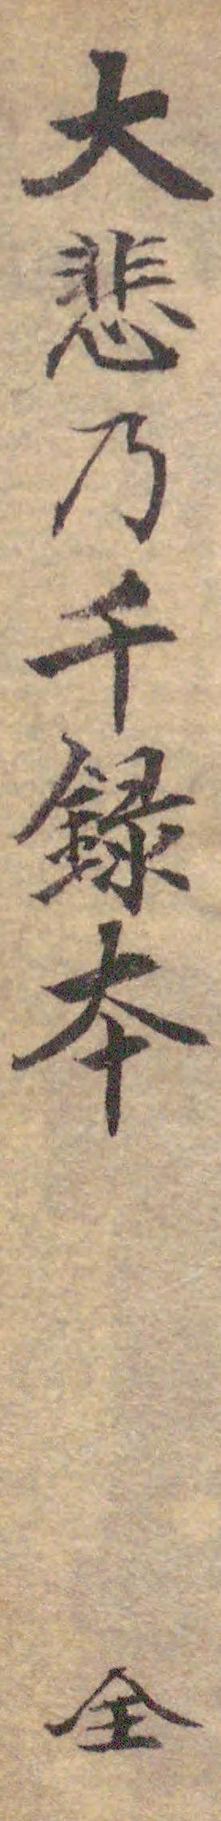大悲乃千録本全

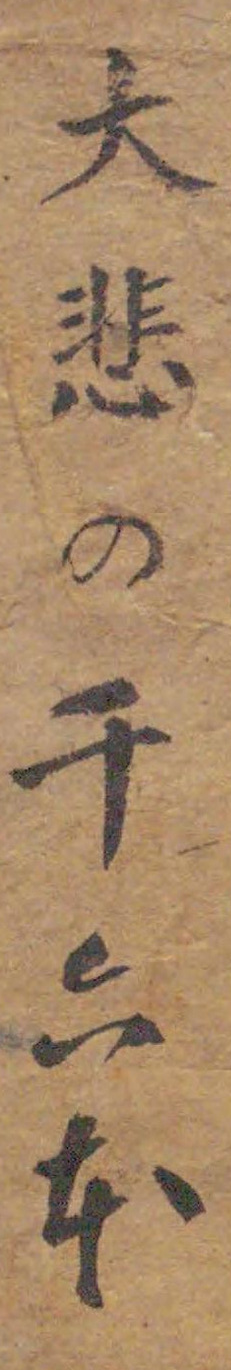大悲の千六本

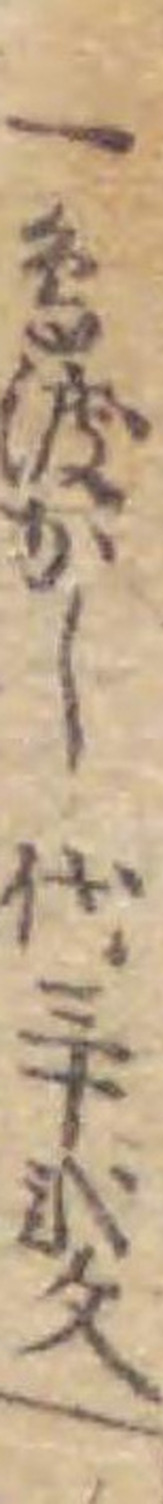一鳥渡かし代三十弐文
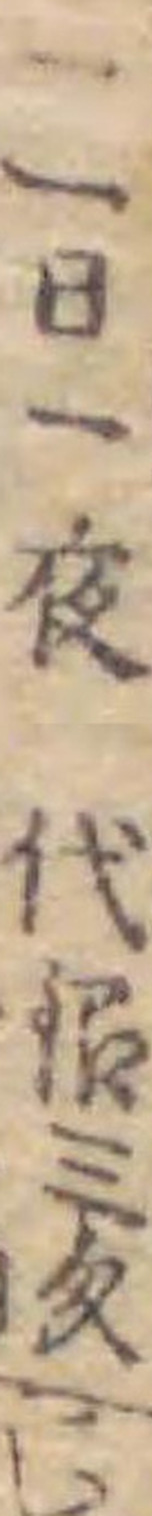一一日一夜代銀三匁
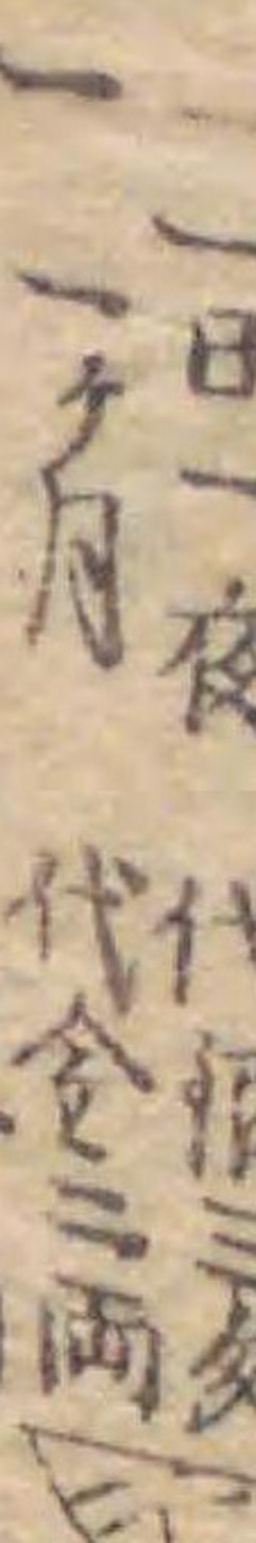一一ヶ月代金二両
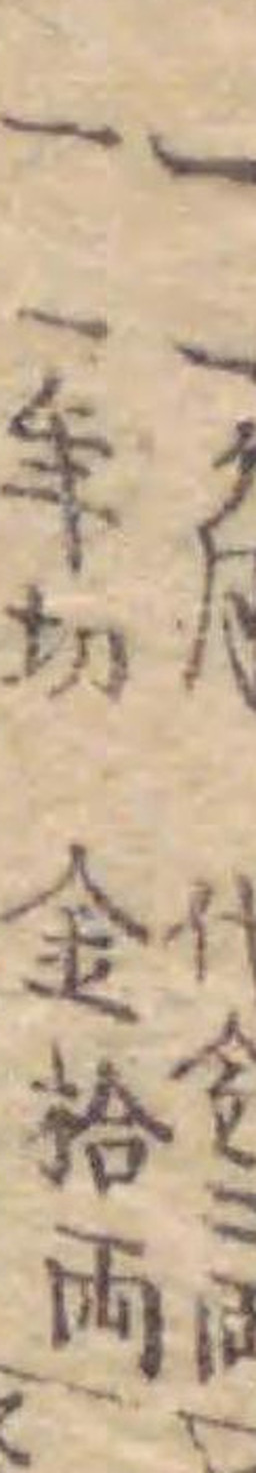一一年切金拾両
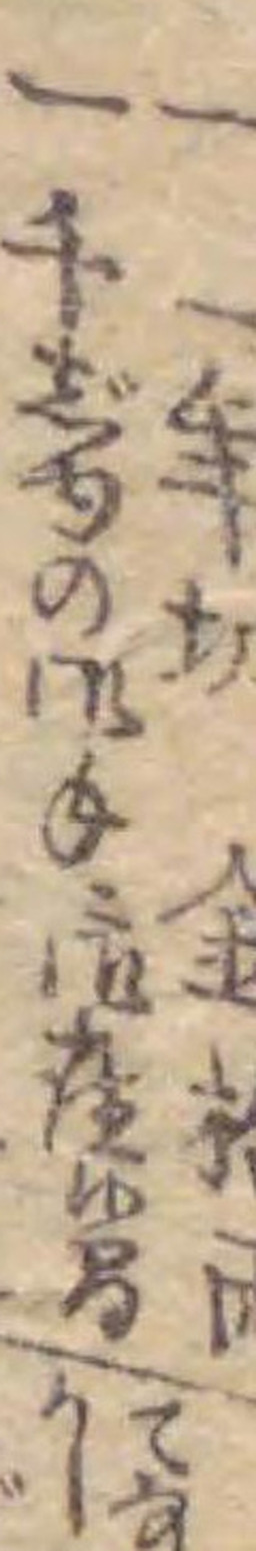一千じゆの御手に御座候間
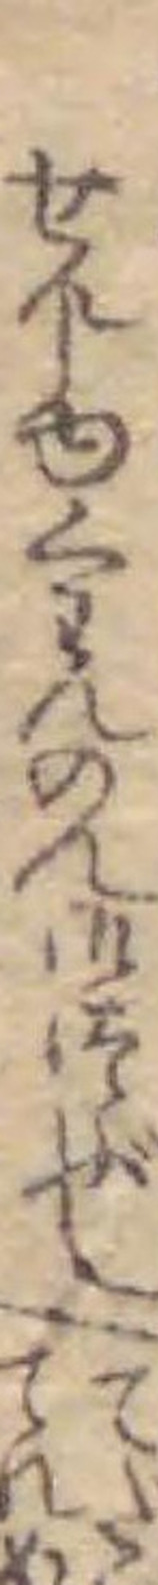せんしゆくわんのん御つぶし
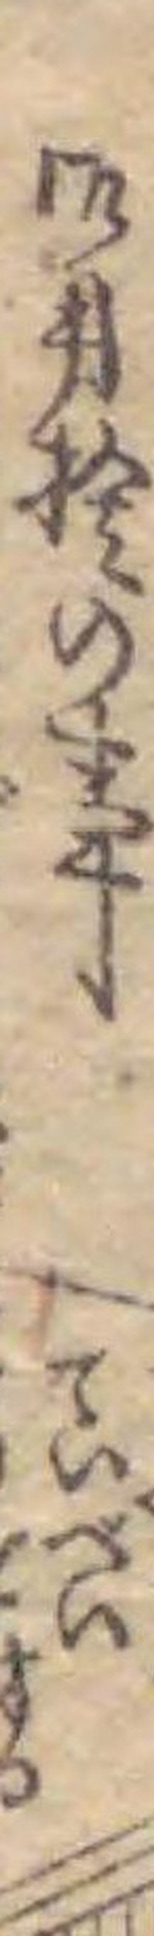御用捨の事
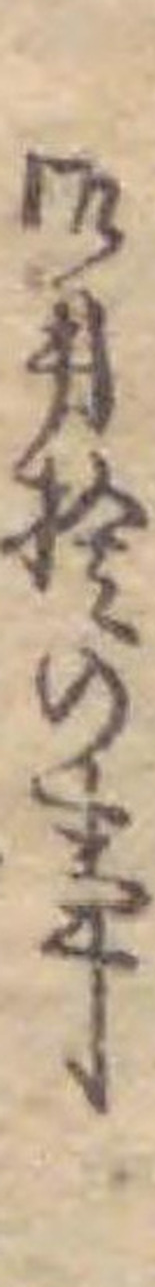御用捨の事
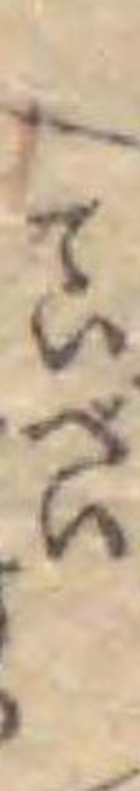ていべい
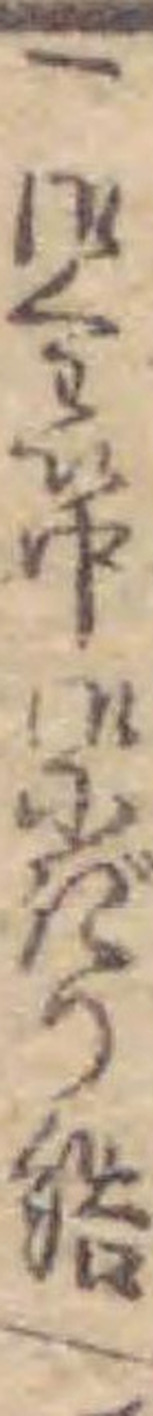一御くわい中御にぎり結
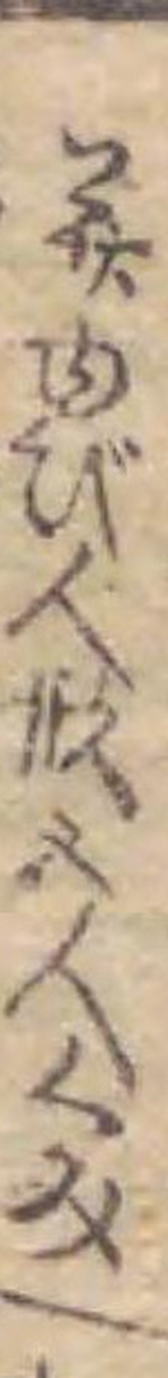并ゆび人形五人くみ
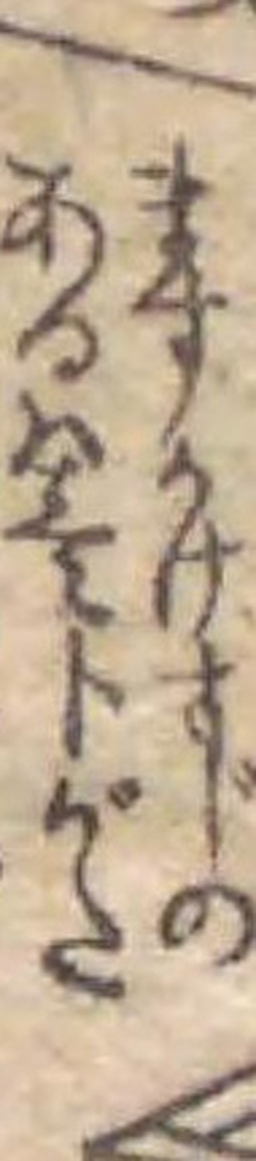あるは壱分がた
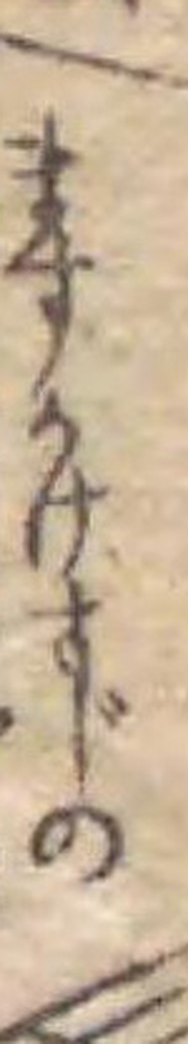ますかけすじの
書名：大悲の千六本 : 1巻
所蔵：国立国会図書館 National Diet Library, JAPAN
